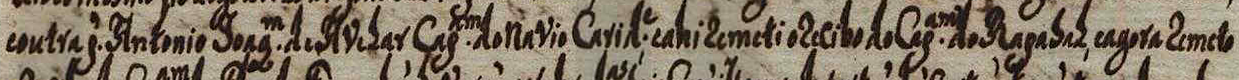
e outra p̄. Antonio Ioaq.m de AVelar Cap.am do navio Carid.e e ahi Remeti o ReCibo do Cap.am do Rapasal, e agora Remeto
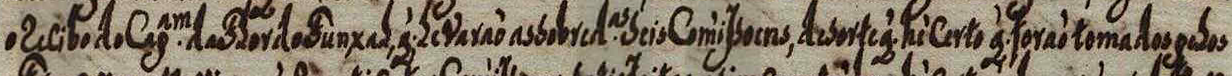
o Recibo do Cap.am da Bordo Funxal, q̄ leVaraõ as sobred.as seis Comissoins, de sorte q̄ li Certo q̄ foraõ tomados pelos
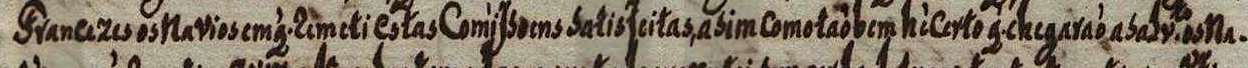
Francezes os Navios em q̄ Remeti estas Comissoens satisfeitas, asim como taõbem hé certo q̄ chegaraõ a salv.to os Na
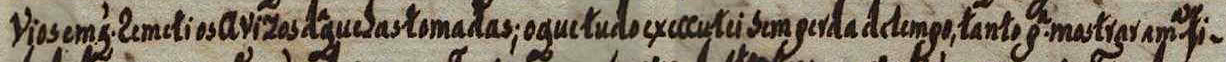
vios em q̄. Remeti os avizos d'quelas tomadas; o que tudo exeCCutei sem perda de tempo, tanto p.a mostrar a ma fi
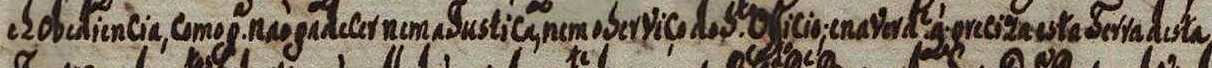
el obediencia, como p̄ naõ padecer nem a Iustica, nem o serviço do S.to Officio, e na verde q̄. preciza esta Terra desta
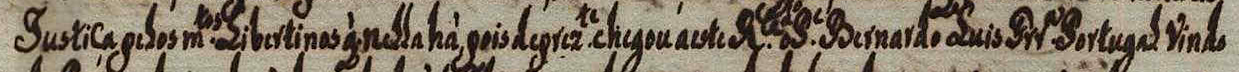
IustiÇa pelos m.tos Libertinos q̄ nella há pois de prezte chegou a este R.ce o P.e Bernardo Luis Frr.a Portugal Vindo
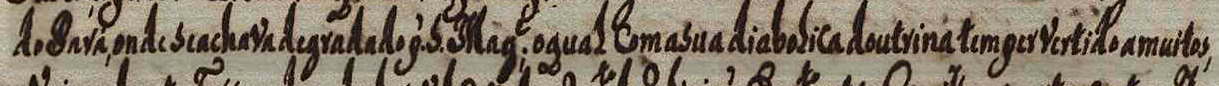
do Para, onde se achara degradado p̄ S. Mage; o qual com a sua diabolica doutrina tem pervertido a muitos,
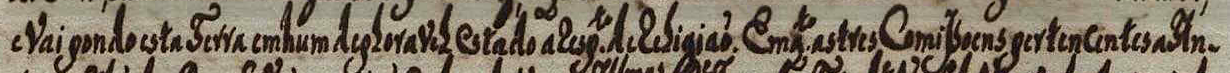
e Vai pondo esta Terra em hum deploravel estado a Resp.to de Religiaõ Emqto as tres Comissoens pertenCentes a An
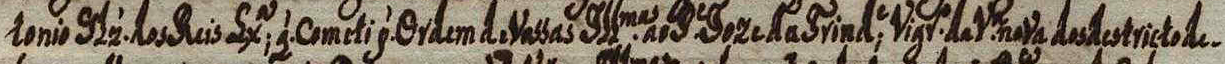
tonio Glz̄. dos Reis Lx.a; q̄ cometi p̄ Ordem de Vossas Ill.mas ao P.e Ioze da Trind;e Vigr.o da V. nova dos destrito de
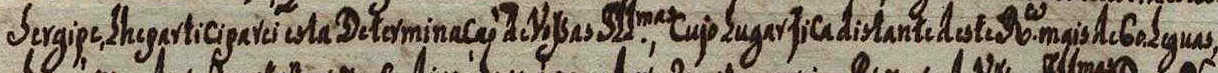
Sergipe, lhe participarei esta Determinaçaõ de Vossas Ill.mas Cujo Lugar fica distante deste R.co mais de 60. leguas,
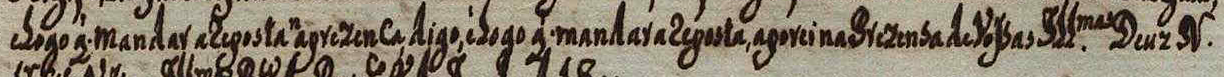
e logo q̄ mandar a Resposta apreZenÇa digo, e logo q̄ mandar a Resposta, a porei na PreZensa de Vossas Ill.mas Deuz N.
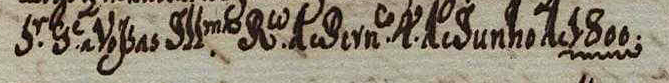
S.r G.e a Vossas Ill.mas R.co de Pern.co 4. de Iunho de 1800;
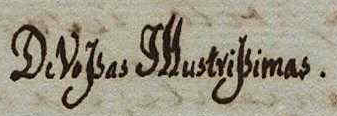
De Vossas Illustisimas.
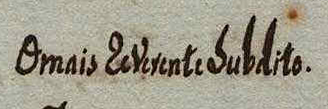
O mais ReVerente subdito.
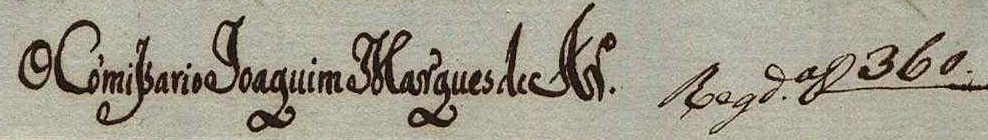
O Comissario Ioaquim Marques de Ar.o Regd.a f360.
